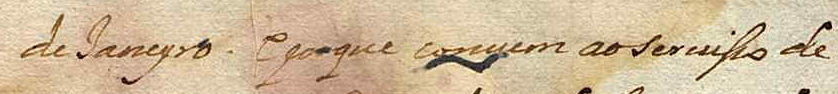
de Ianeyro. E po que conuem ao seruisso de
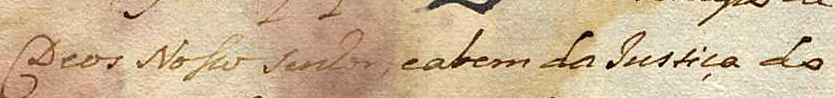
Deos Nosso Senhor, e a bem da Iustiça do
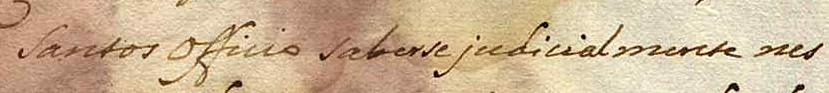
Santos Officio saberse judicialmente nes
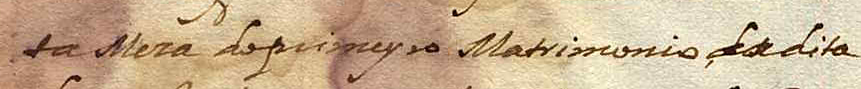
ta Meza do primeyro Matrimonio da dita
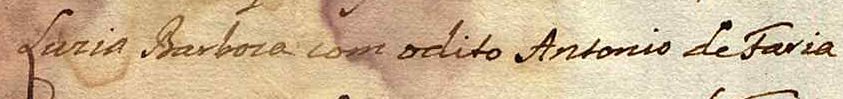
Luzia Barboza com o dito Antonio de Faria
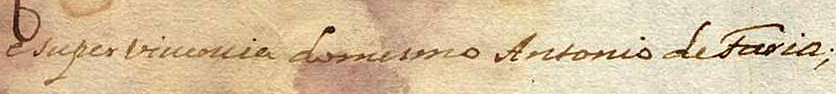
e superviuencia do mesmo Antonio de Faria;
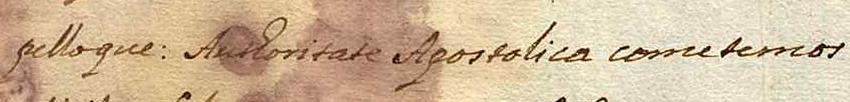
pello que: Authoritate Apostolica cometemos
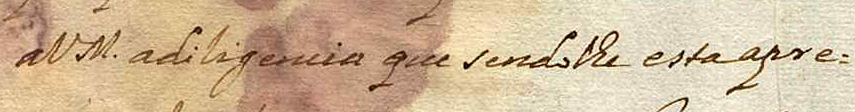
a VM. a diligencia que sendolhe esta apre
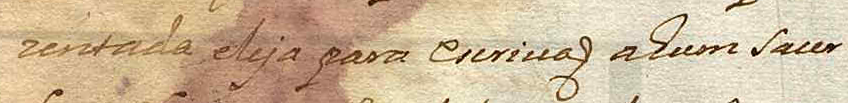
zentada eleja para escriuaõ a hum sacer
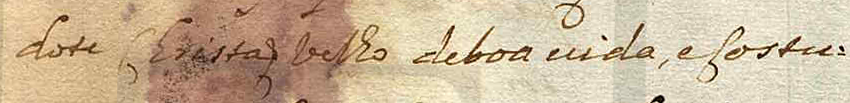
dote Christaõ velho de boa uida, e Costu
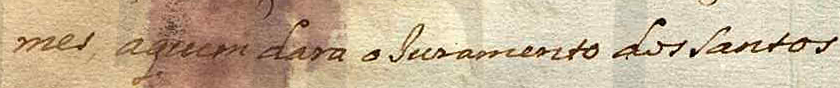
mes, a quem dara o Iuramento dos Santos
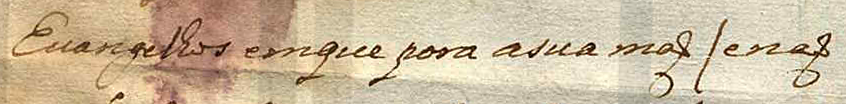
Euangelhos em que pora a sua maõ / e naõ
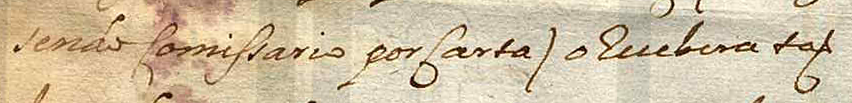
sendo Comissario por Carta / o Recebera taõ
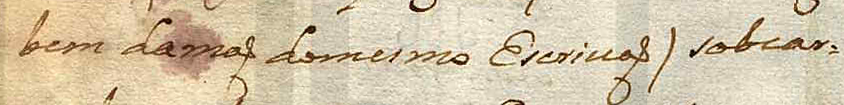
bem da maõ do mesmo Escriuaõ / sob car
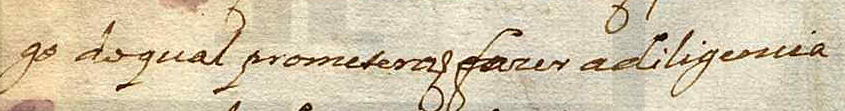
go do qual prometeraõ fazer a diligencia
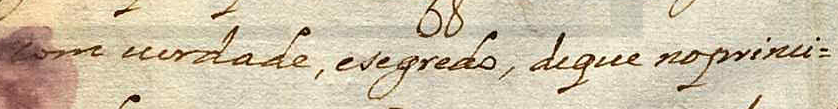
com uerdade, e segredo, de que no princi
